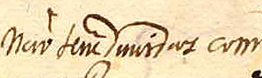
naõ tem duuidas com
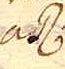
a R.
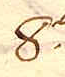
8.o
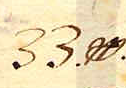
33. ttos.
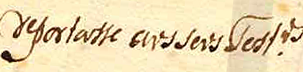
deportasse aos seus Test.os
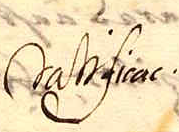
ratificac.
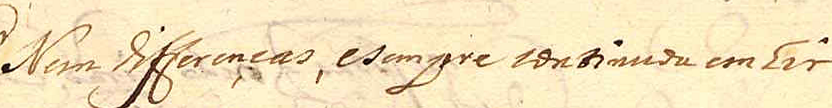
Nem differenças, e sempre continuou em hir
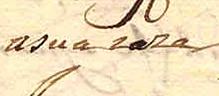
a sua caza
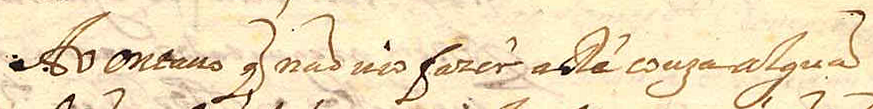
Ao outauo q̄ naõ uio fazer a Ré couza alguā
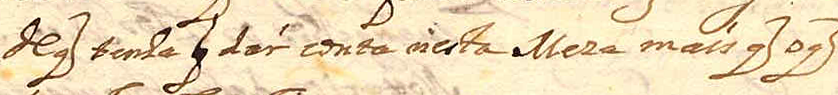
de q̄ tenha q̄ dar conta nesta Meza mais q̄ o q̄
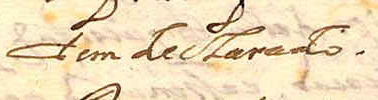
tem declarado.
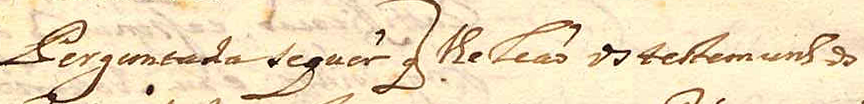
Perguntada se quer q̄ lhe leaõ os testemunhos
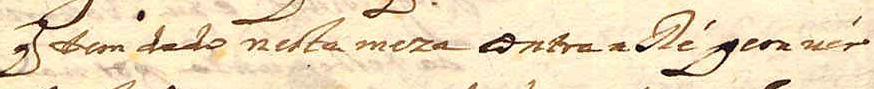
q̄ tem dado nesta meza contra a Ré pera uer
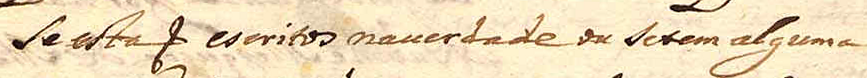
se estaõ escritos na uerdade ou se tem alguma
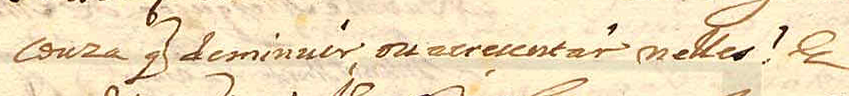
couza q̄ deminuir, ou acrecentar nelles? E
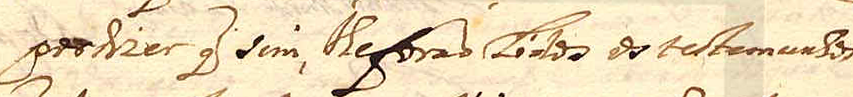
por dizer q̄ sim, lhe forão Lidos os testemunhos
